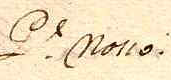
P.e nosso.
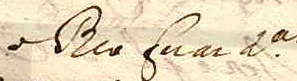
o Reo fez as d.as
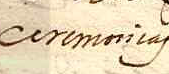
ceremonias
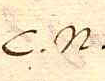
c. n.
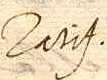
Ratif.
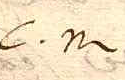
c. no
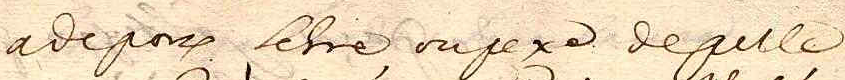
a de porco, lebre, ou pexe de pelle,
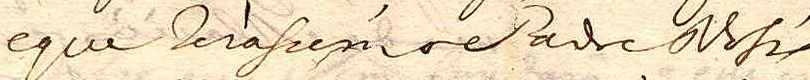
e que Rezassem o Padre Nosso
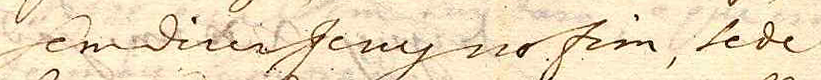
sem dizer Jesus no fim, se de
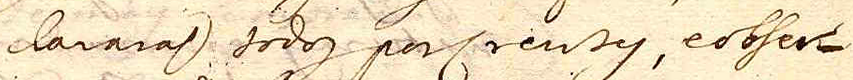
clararaõ todos por Crentes, e obser
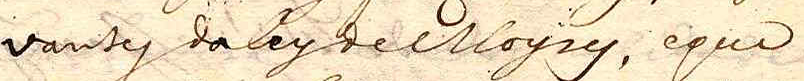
vantes da ley de Moyzes, e que
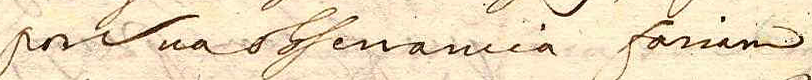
por Sua observancia faziam
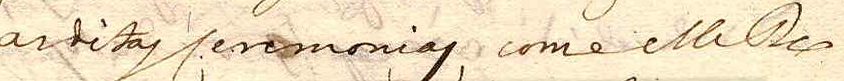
as ditas Ceremonias, como elle Reo
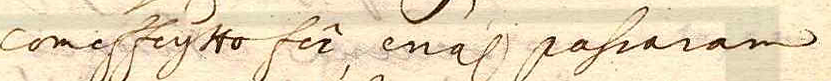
com effeytto fêz, e naõ passaram
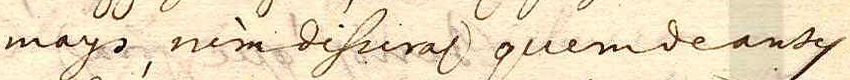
mays, nem disseraõ quem de antes
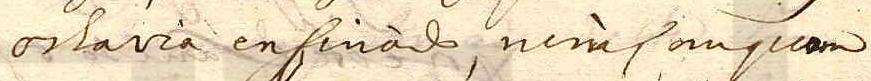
os havia ensinàdo, nem Com quem
